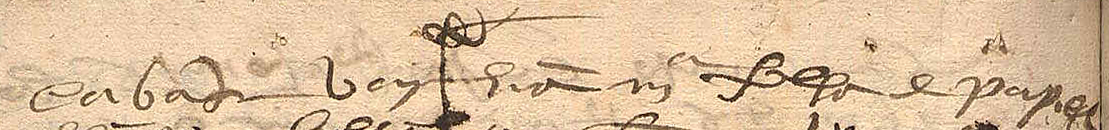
e avāte vaj huā ma folha de papell
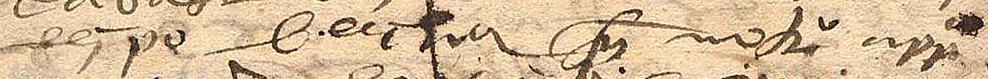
llj̄po bellchior fr̄z notro appco e
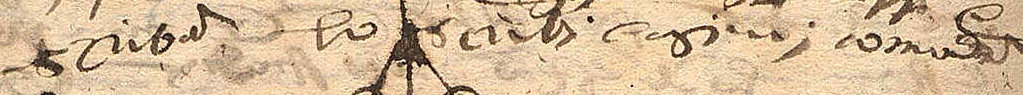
escrivā ho escrevi e asinej como dtō
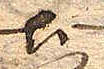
he
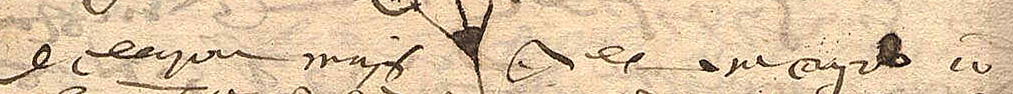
decllarou majs q̄ elle era caasdo cō
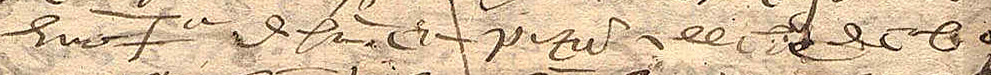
huā fa de hū capitaõ ellche de cabo
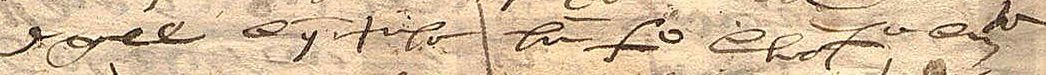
de guell e q̄ tinha hū fo e hua fa e mta
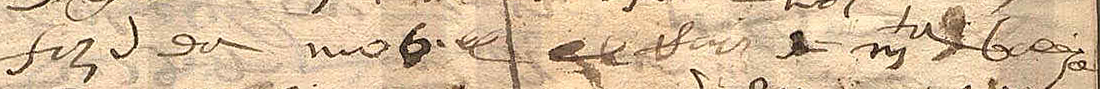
fazēda movell e de Raiz de mta vallja
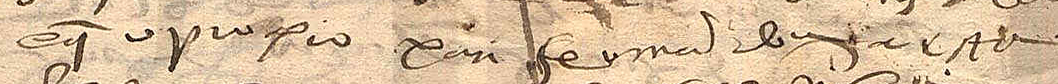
e q̄ o propio xarife o mādou ha esta
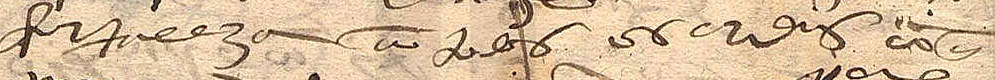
fortalleza c̄o todos os ardis cō q̄
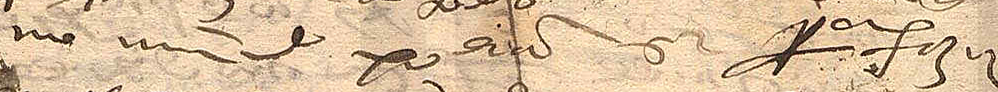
no mūdo podiaõ ser ꝑa fazer
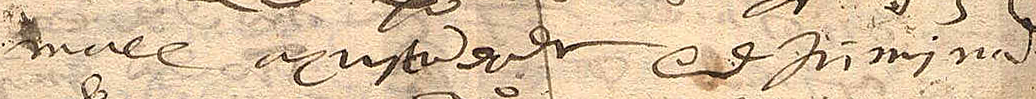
mall a cristādade e detrimjnā
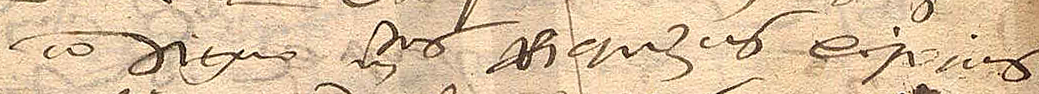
cōsiguo mtas Riquezas e joias
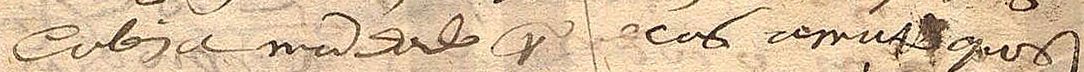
e avia mādado p̄o ellas a maRoquos
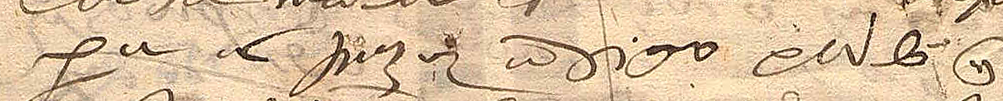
ꝑa as trazer cōsigo e vēdo q̄
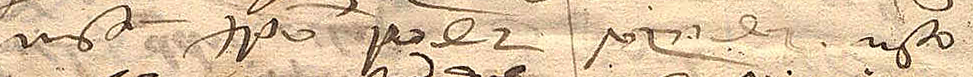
neste tpō poder soceder nisto
